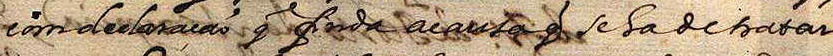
com declaraçaõ q̄ finda a causa q̄ se ha de tratar
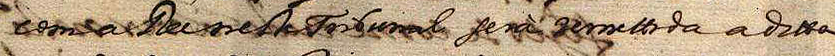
com a Ree neste Tribunal serà remettida a ditta
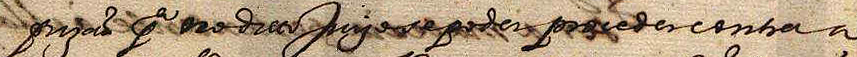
prizaõ pa no ditto Juizo se poder proceder contra a
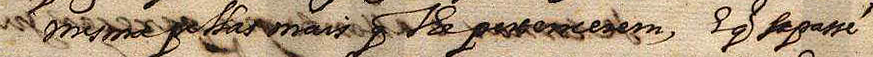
mesma pellas mais q̄ lhe pertencerem, E q̄ se passē
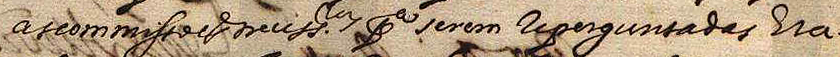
as commissoẽs necess.rias pa serem Reperguntadas E ra
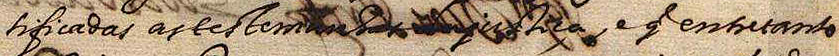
tificadas as testemunhas da justiça, e q̄ entretanto
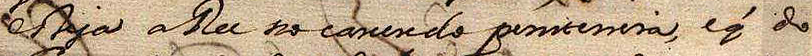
esteja a Ree no carcere do penitencia, e q̄ do
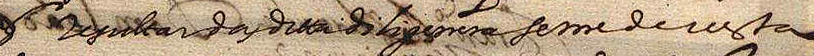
q̄ resultar das ditta diligencia se me de uista
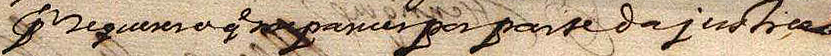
pa requerer o q̄ me parecer por parte da justiça
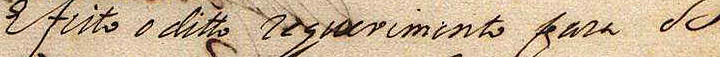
E feito o ditto requerimento para oS
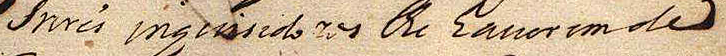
snres̄ inquisidores lhe hauerem de
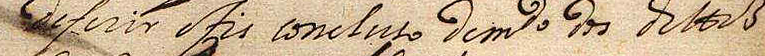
deferir o fis concluso de mdo dos dittos
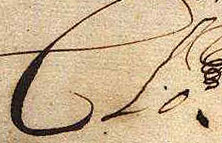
CLo.
